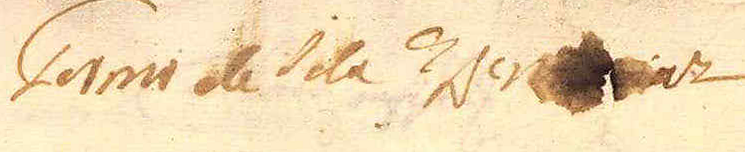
Termo de Ida E per_az
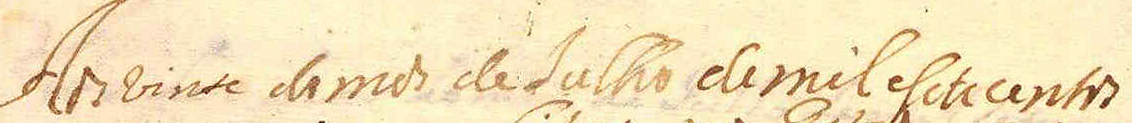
Aos vinte do mes de Iulho de mil e setecentos
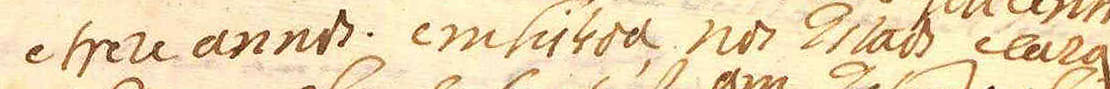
e treze annos. em lisboa, nos Estaos e caza
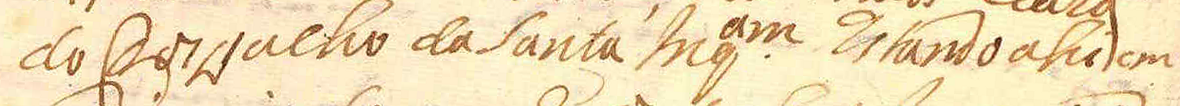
do Despacho da santa Inq.am Estando ahi em
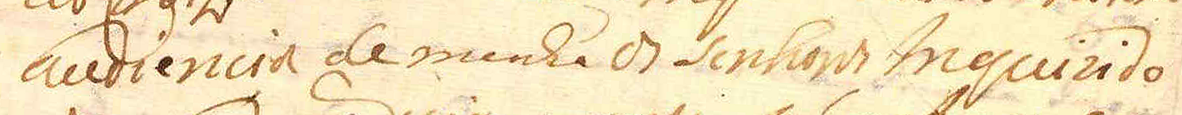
audiencia de manhã os senhores Inquizido
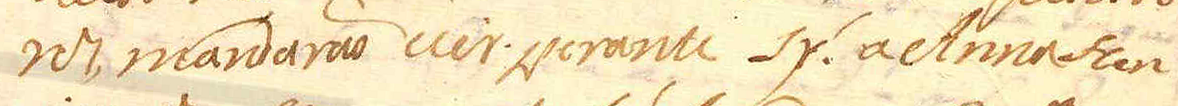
res, mandaraõ uir perante sy. a Anna Hen
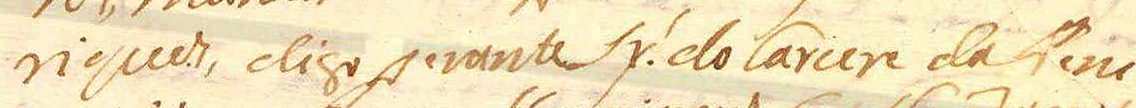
riques, digo perante sy. do Carcere da Peni
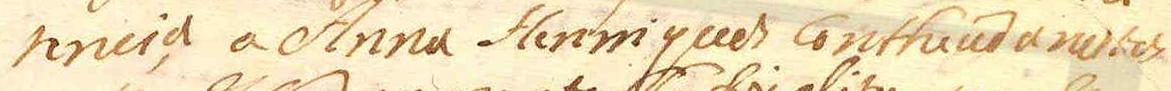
tencia, a Anna Henriques Contheuda nestes
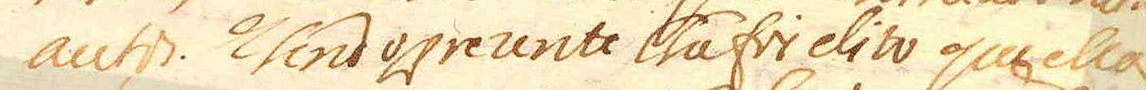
autos. E sendo prezente lhe foi dito que ella
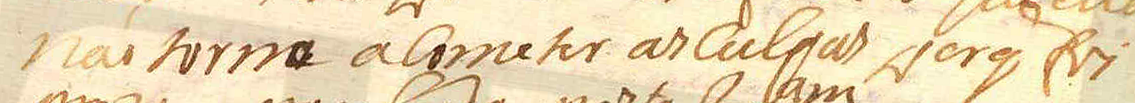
naõ torne a Cometer as culpas porq foi
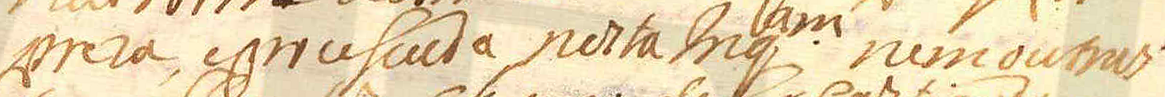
preza, e processada nesta Inqam. nem outras
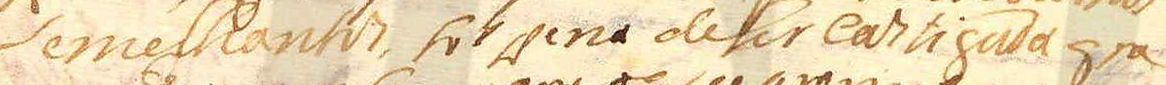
semelhantes, sob pena de ser castigada gra
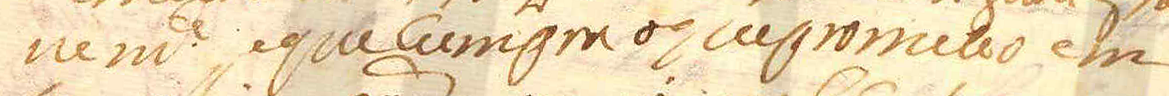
uemte. e que Cumpra o que prometeo em
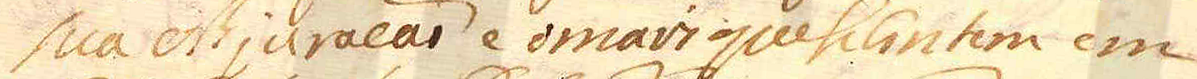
sua Abjuração e o mais que se Contem em
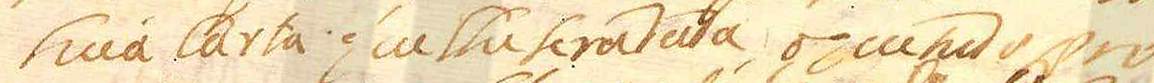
huā Carta que lhe sera dada, o que tudo pro
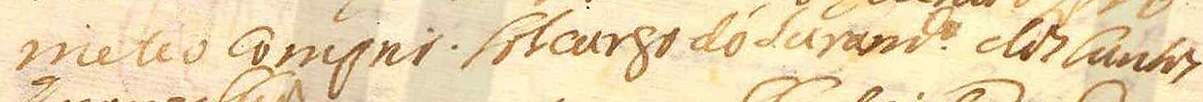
meteo comprir. sob cargo do Iuramt.o dos Çantos
